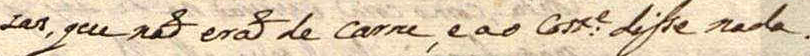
zas, que naõ eraõ de carne, e ao cost:e disse nada.
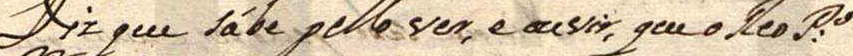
Diz que sábe pello ver, e ouvir, que o Reo P:o
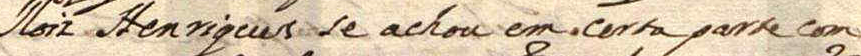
Roīz Henriques se achou em certa parte com
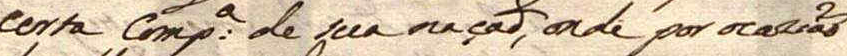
certa comp:a de sua naçaõ, onde por ocaziaõ
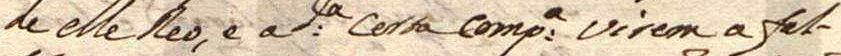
de elle Reo, e a d:a certa comp:a virem a fal
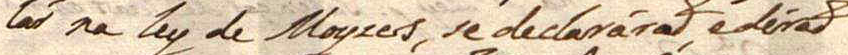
lár na ley de Moyzes, se declaráraõ, e déraõ
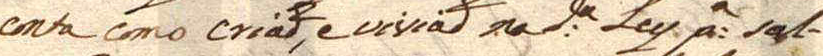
conta como criaõ, e viviaõ na d:a Ley p:a sal
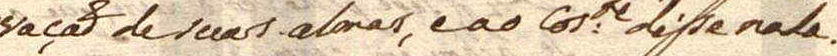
vaçaõ de suas almas, e ao cos:te disse nada.
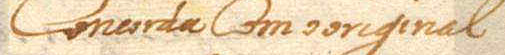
Concorda Com o original
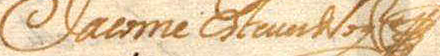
Jacome Esteues Nogra
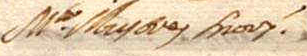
M.to Illustres Snors̄.
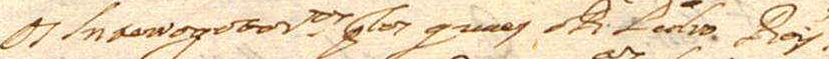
Os Interrogator.os plos quaes o R. Pedro Rois̄
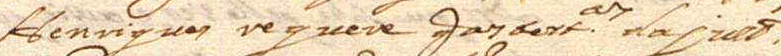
Henriques requere q̄ as test.as da just.a
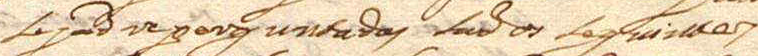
sejaõ reperguntadas saõ os seguintes
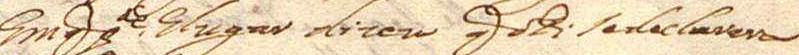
Em q̄ pte. E lugar dizem q̄ o R. se declarava
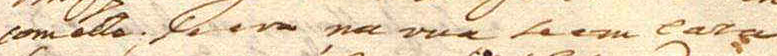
com elle; se era na rua, se em caza
